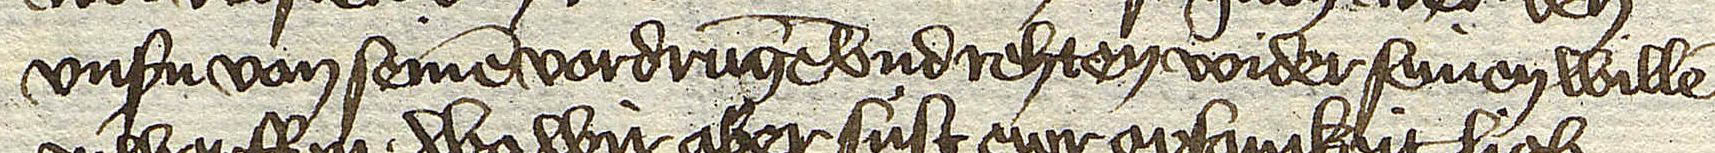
vnſ*n von ſeine* vordru*ge* vnd rehten wider ſeinen wille*
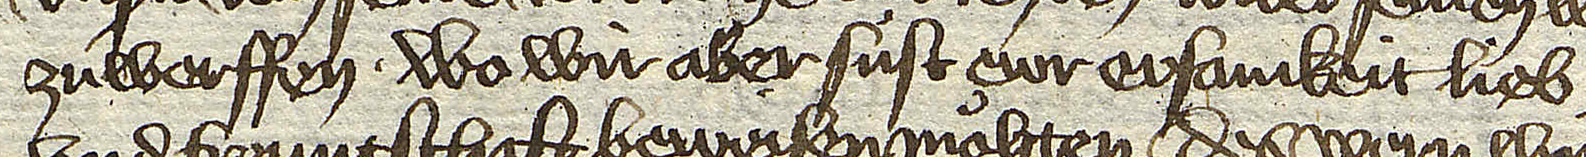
cʒuwerffen . Wo wir aber ſüſt ewr erſamkeit lieb
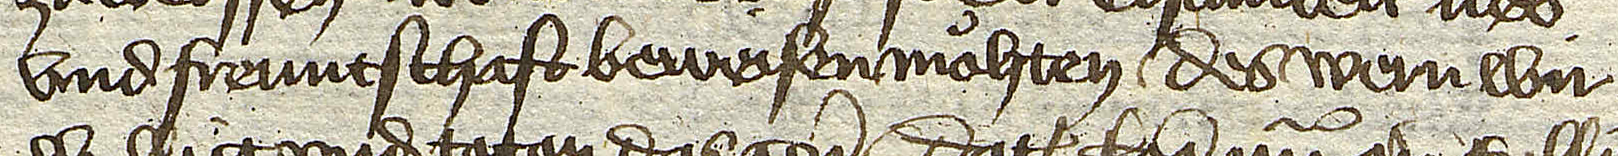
vnd freuntſchaft beweiſen möhten / des wern wir
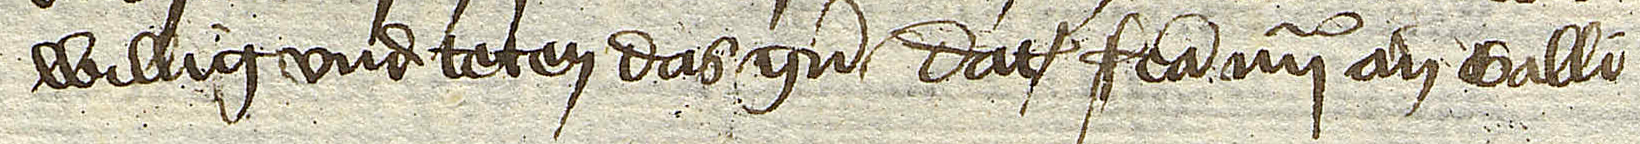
willig vnd teten das gn* / Dat* fea* iiii* an* Galli
